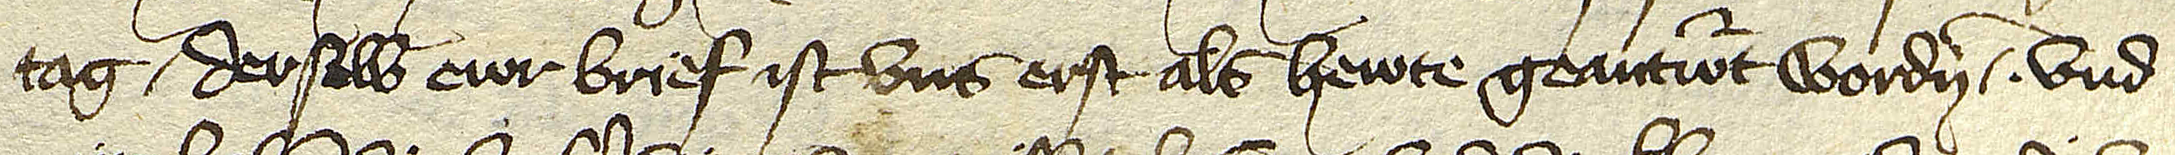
tag / derſelb ewr brief iſt vns erſt als hewte geantw*t wordn* / . vnd
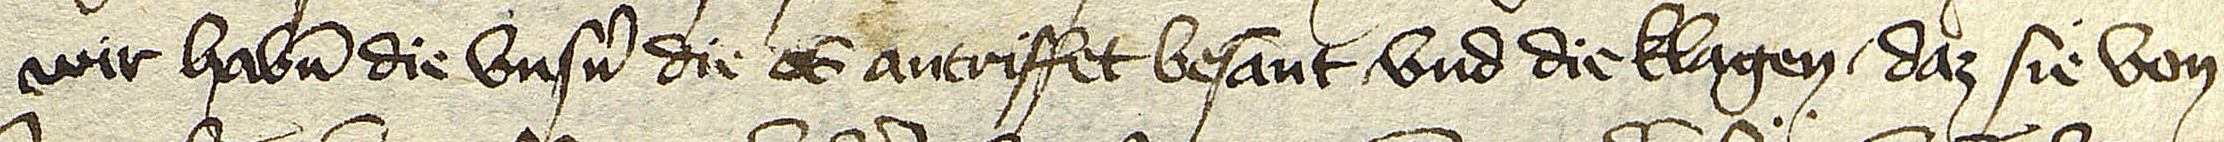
wir habn* die vnſn* die es antriffet beſant / vnd die klagen / daʒ ſie von
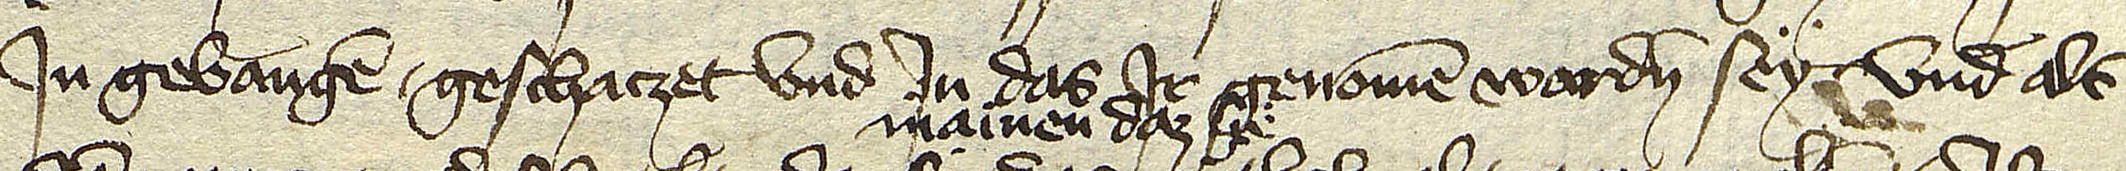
In gevange* / geſchacʒet vnd In das Ir genome* wordn* ſey / vnd als
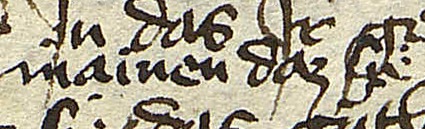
mainen daʒ ſie
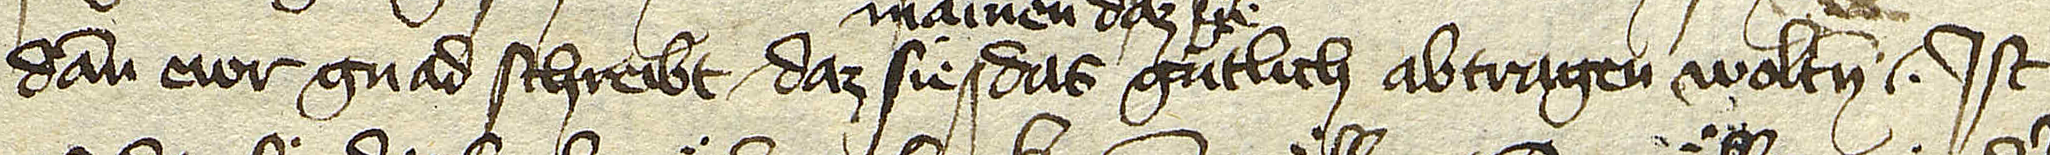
dan* ewr gnad ſchreibt / daʒ ſie das gütlich abtragen woltn* / . Iſt
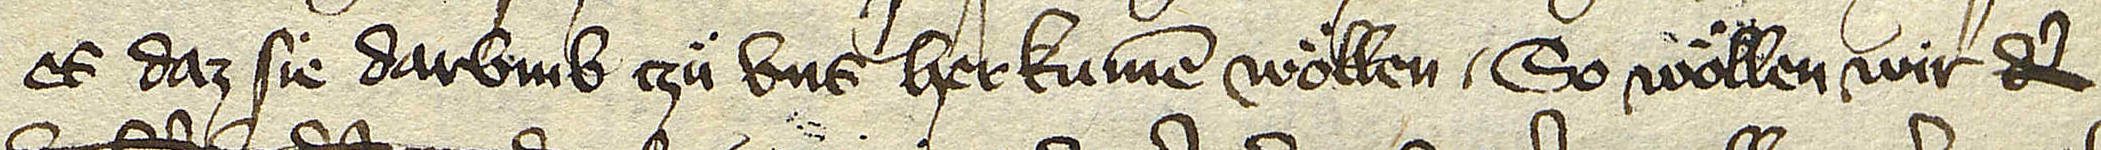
es daʒ ſie darvmb cʒü vns herkume* wöllen / So wöllen wir d*
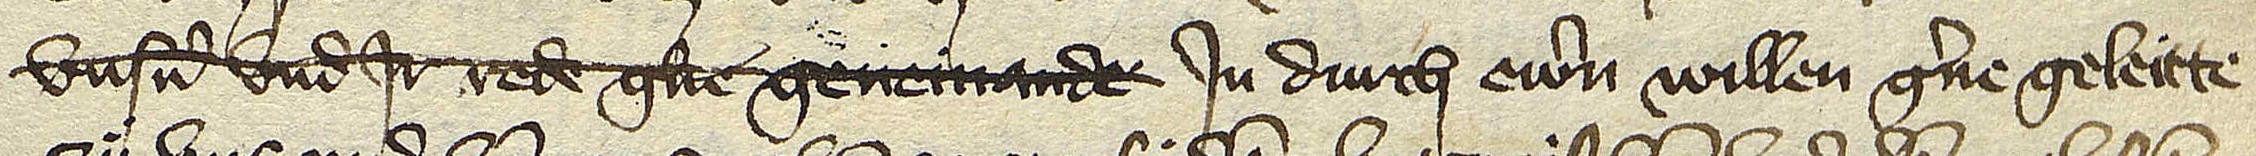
vnſn* vnd Ir rede g*ne geneinande In durch ew*n willen g*ne geleitte
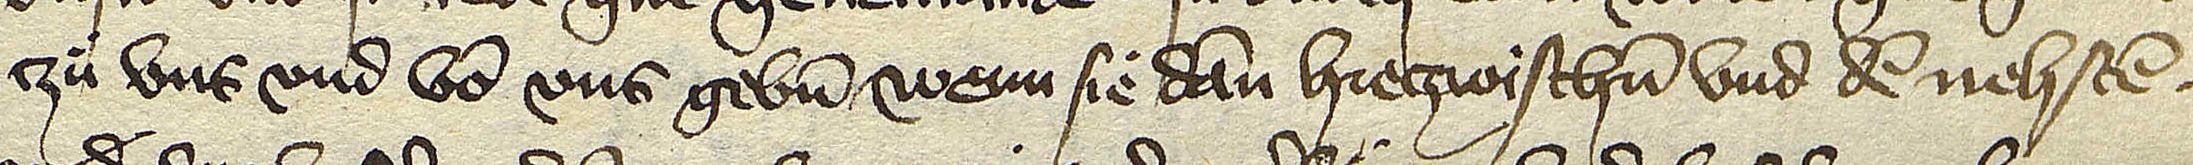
cʒü vns vnd vo* vns gebn* / wenn ſie dan* hiecʒwiſchn* vnd d* nehſte* /
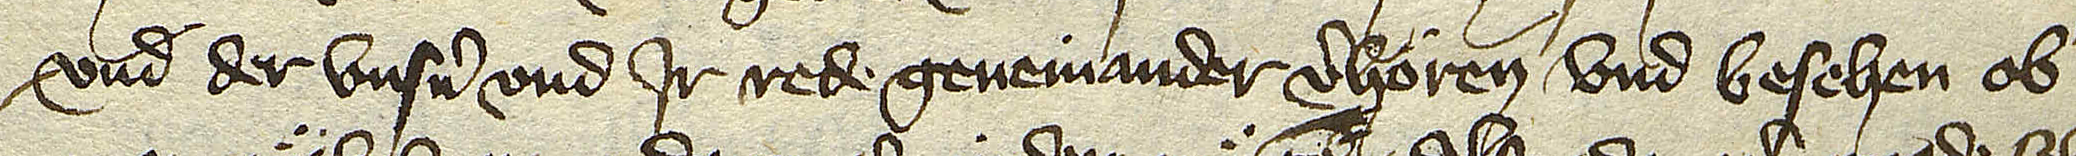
vnd der vnſn* vnd Ir rede geneinander v*hören / vnd beſehen ob
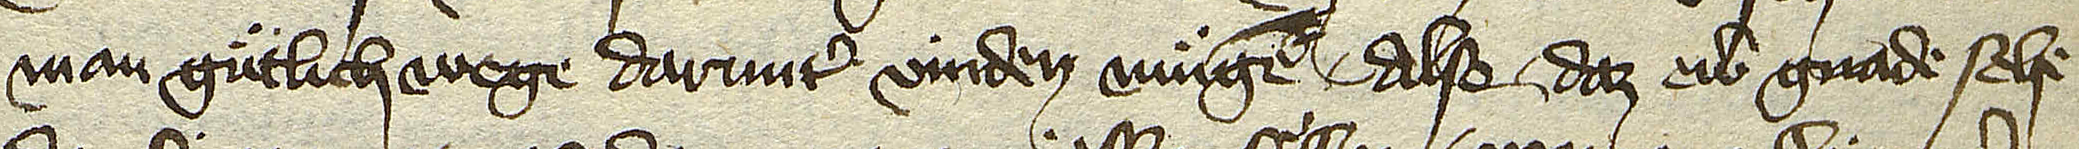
man gütlich wege darunt* vinden müge / Alſo / daʒ ew* gnade ſehe
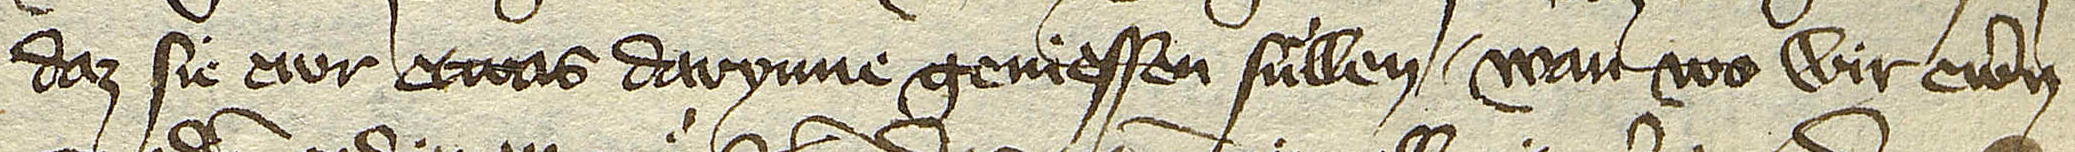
daʒ ſie ewr etwas darynne genieſſen ſüllen / wan wo wir ew*n
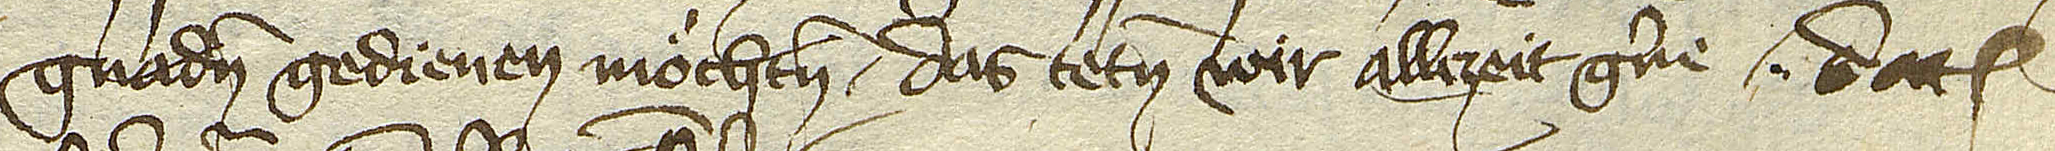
gnad*n gedienen möchtn* / das tetn* wir allcʒeit g*ne / . dat*
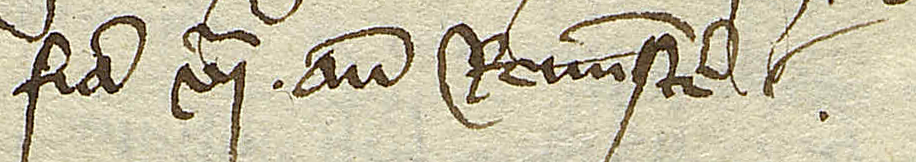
fia* vi* . an* Reimſce* / .
